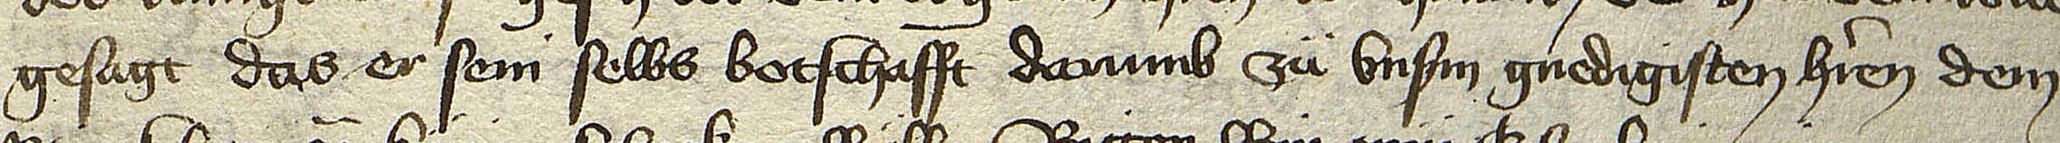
geſagt das er ſein ſelbs botſchafft darumb cʒü vnſ*m gnedigiſten h*ren dem
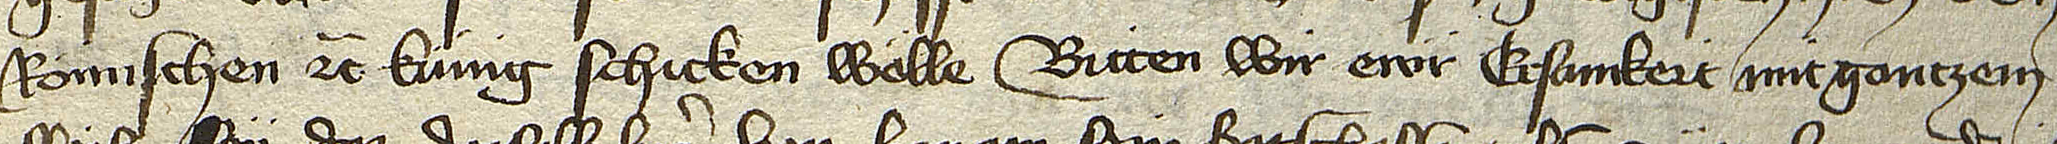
Römiſchen ec* künig ſchicken wölle Bitten wir ewr Erſamkeit mit gancʒem
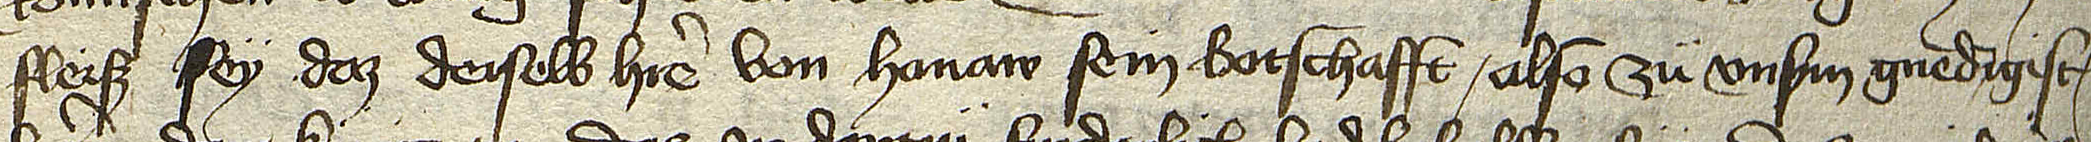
fleiſʒ ſey daʒ derſelb h*re von hanaw ſein botſchafft / alſo cʒü vnſ*m gnedigiſt*
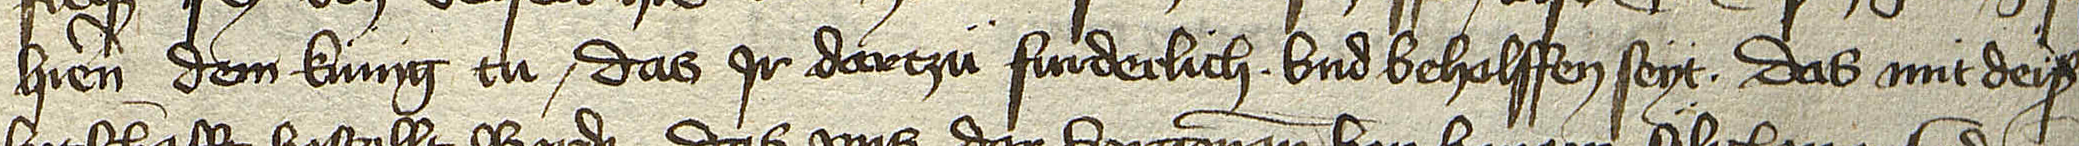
h*ren dem künig tu / Das Ir darcʒü furderlich . vnd beholffen ſeyt . Das mit derſ*
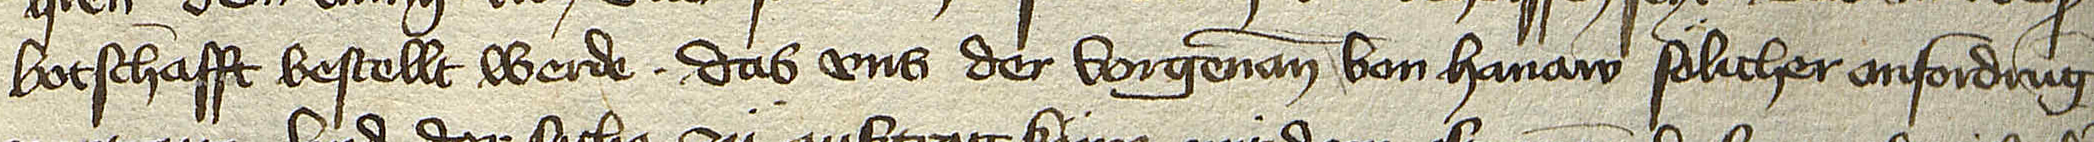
botſchafft beſtellt werde . das vns der vorgenan* von hanaw ſölicher anfordru*g
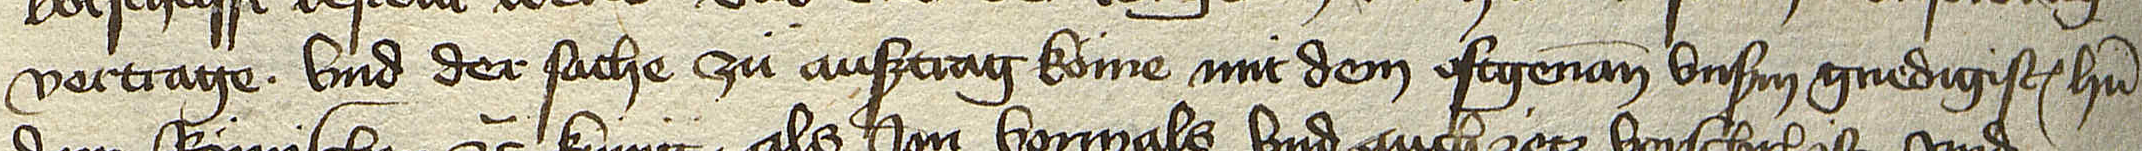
vertrage . vnd der ſache cʒü auſʒtrag köme mit dem oftgenan* vnſ*m gnedigiſt* h*n
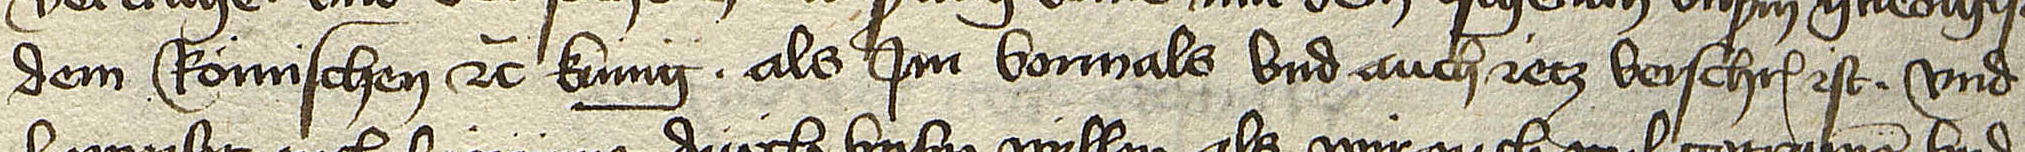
dem Römiſchen ec* künig . als Im vormals vnd auch iecʒ verſchr* iſt . vnd
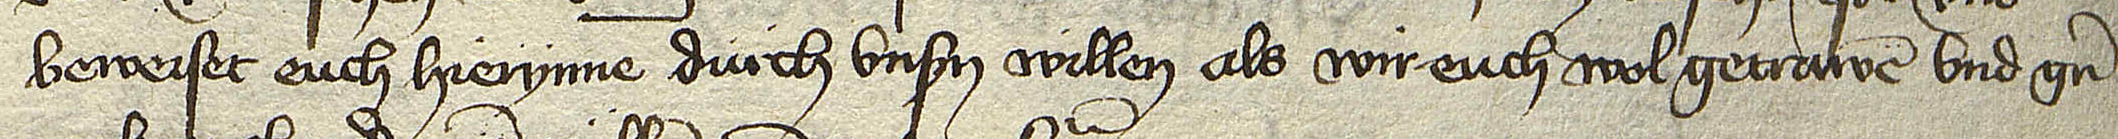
beweiſet euch hierynne durch vnſ*n willen als wir euch wol getrawe* vnd g*n
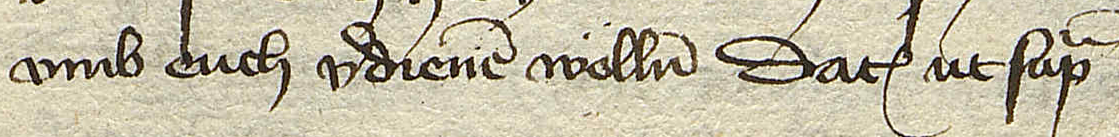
vmb euch v*diene* wöll*n Dat* ut ſup*
